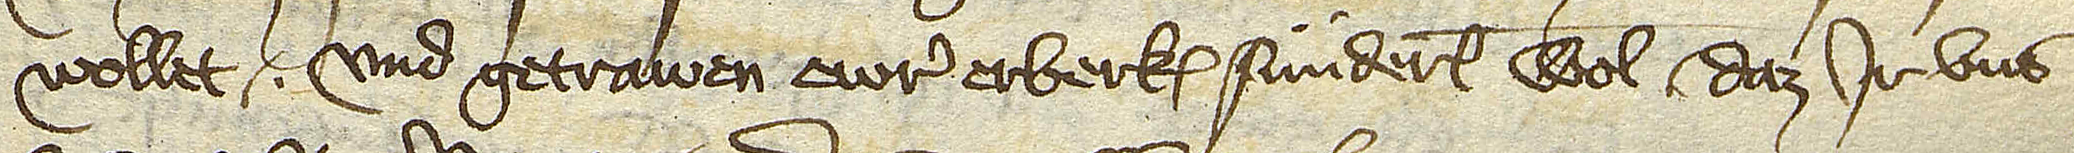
wollet / . vnd getrawen ewr* erberk* ſünderl* wol / daʒ Ir vns
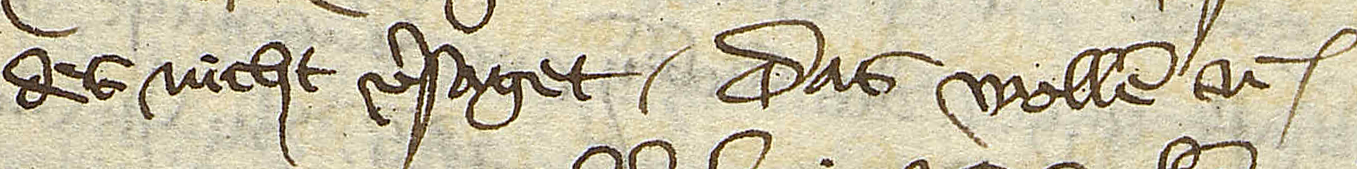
des nicht v*ſaget / Das wolle* ec*
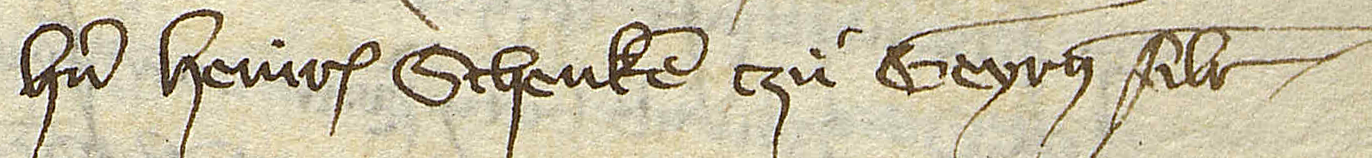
hn* heinr* Schenke* cʒü Geyrn* ſilr* /
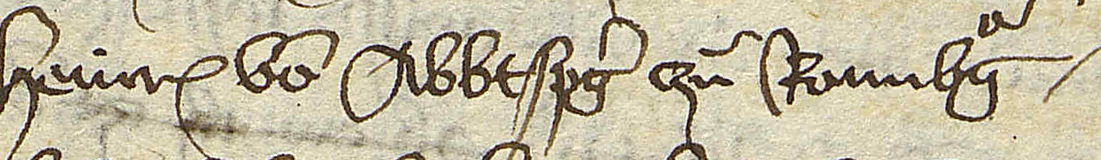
heinr* vo* Abbtſp*g cʒü Ronnb*g /
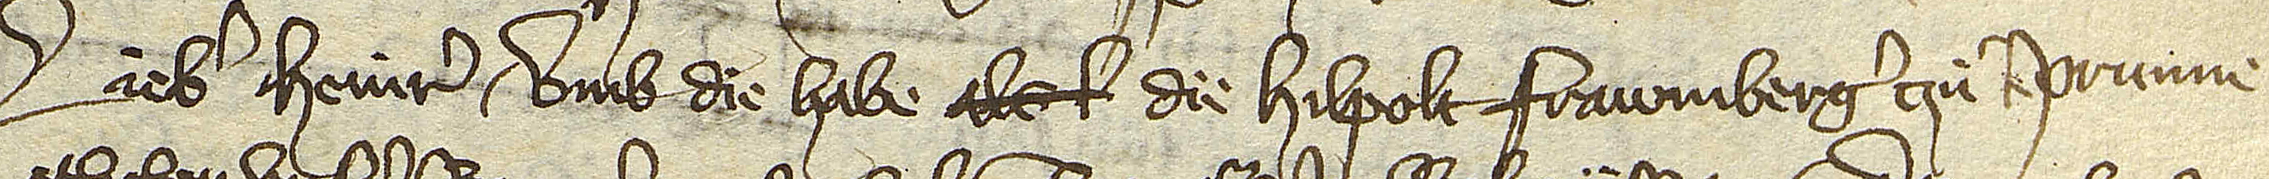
Lieb* heinr* / vmb die habe als h die hilpolt Frawmberg* cʒü Prunne
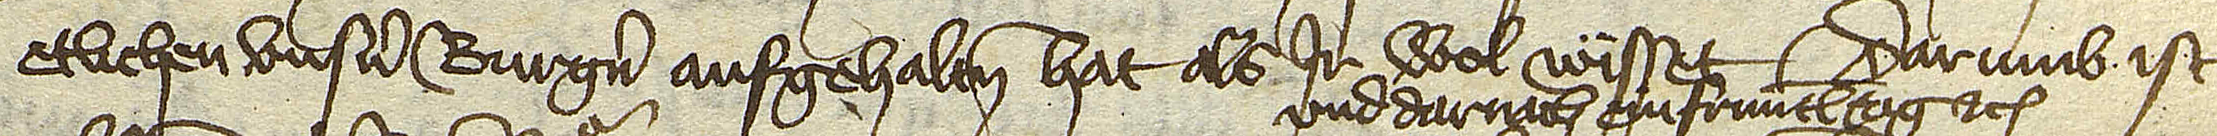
etlichen vnſn* Burgn* aufgehaltn* hat als Ir wol wiſſet / Darumb iſt
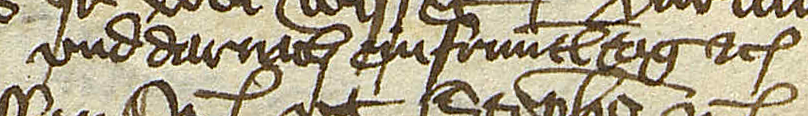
vnd darnach ein fruntl* tag ec*
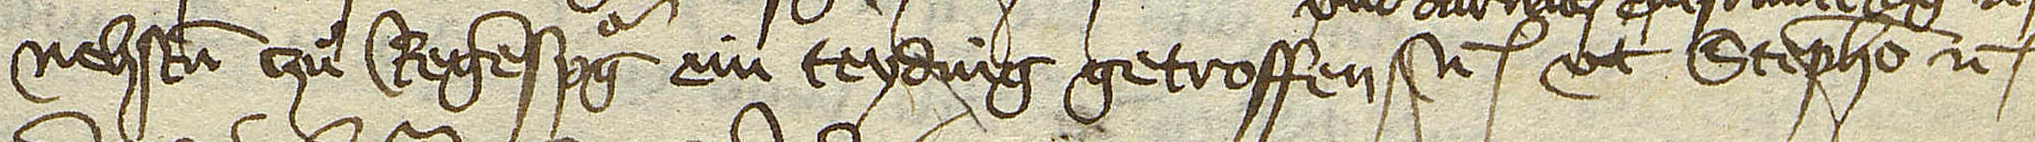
nehſtn* cʒü Rege*ſp*g ein teyding getroffen ec* vt Stepho* ec*
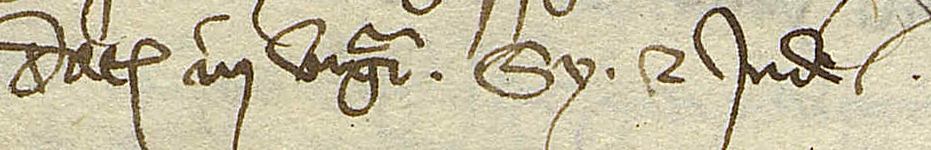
Dat* in vigi* . Sy . @ Iude / .
